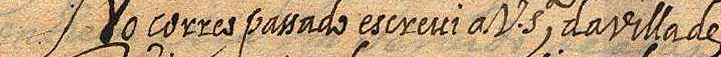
No correo passado escreui a V. Sa, da villa de
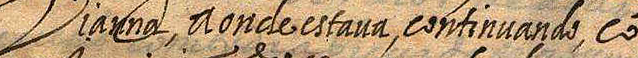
Vianna, aonde estaua, continuando, cō
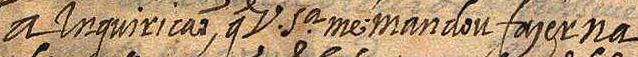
a Inquiricaõ, q̄ V. S.a me mandou fazer na
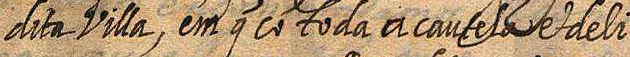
dita villa, em q̄ cō toda a cautela & deli
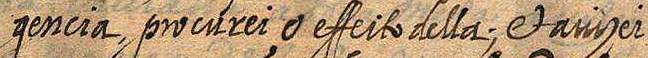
gencia, procurei o effeito della; & auizei
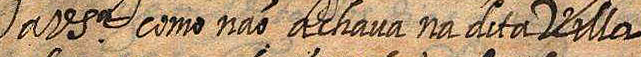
a V S.a como naõ achaua na dita Villa
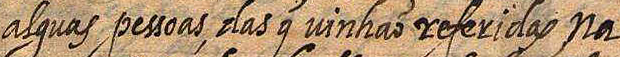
alguas pessoas, das q̄ uinhaõ referidas na
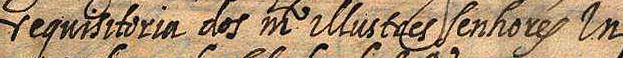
requisitoria dos mto illustres senhores In
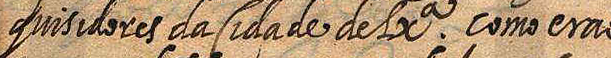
quisidores da Cidade de Lxa. como eraõ
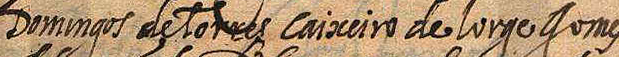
Domingos de Torres caixeiro de Iorge Gomes
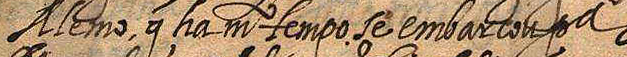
Alemo, q̄ ha mto tempo se embarcou pa o
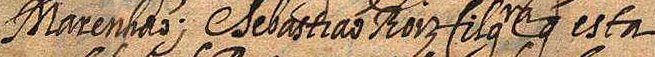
Marenhaõ; e Sebastiaõ Roiz filgra q̄ esta
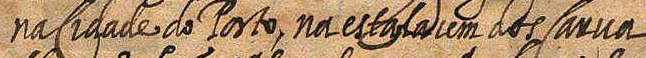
na Cidade do Porto, na estalaiem dos Carua
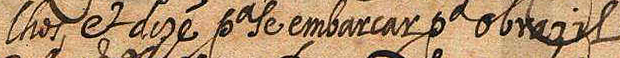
lhos, & dizē pa se embarcar pa o braziL
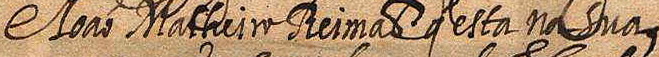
e Ioaõ Matheiro Reimaõ q̄ esta na sua
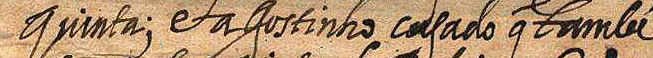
quinta; & agostinho casado q̄ tambē
